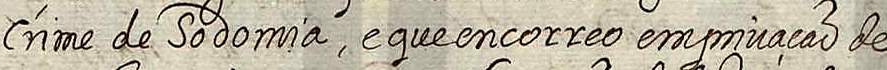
crime de Sodomia, e que encorreo em privação de
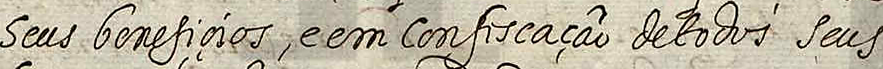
seus benefiçios, e em confiscação de todos seus
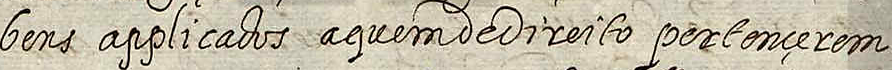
bens applicados a quem de direito pertençerem
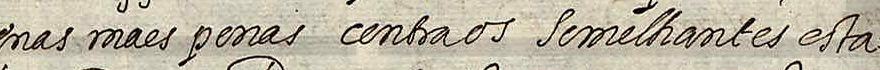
e nas maes penas contra os semelhantes esta
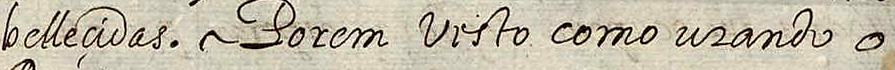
belleçidas. Porem visto como uzando o
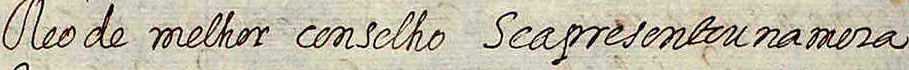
Reo de melhor conselho se apresentou na meza
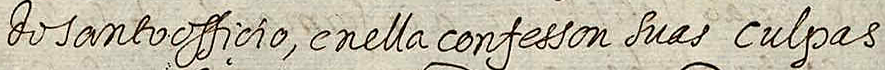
do Santo Officio, e nella confessou suas culpas
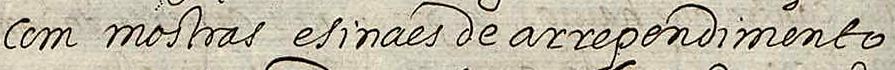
com mostras e sinaes de arrependimento
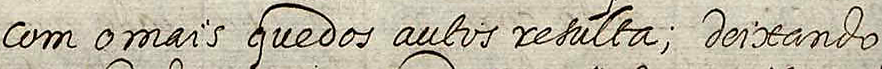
com o mais que dos autos resulta; deixando
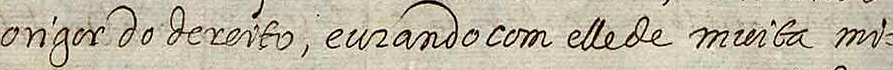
o rigor do dereito, e uzando com elle de muita mi
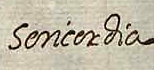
sericordia
